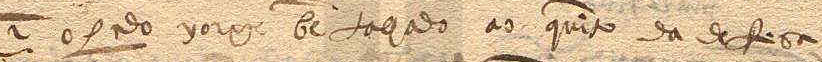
item o Lcdo yorge b̄e talhado ao q̄uito da defesa
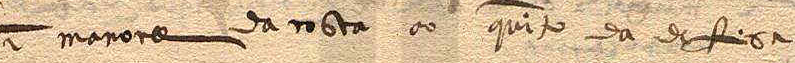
item manoell da costa ao q̄uito da defesa
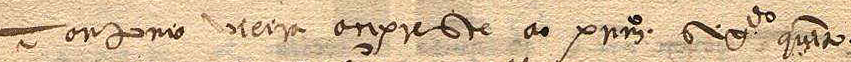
item antonio vieira açipreste ao primo. segdo. qūito.
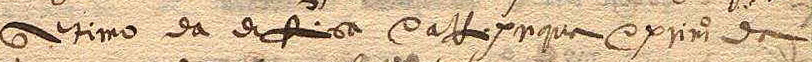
setimo da defesa e a Repriqua e primo da
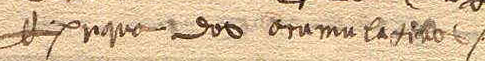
Repriqua dos acumulatiuos /.
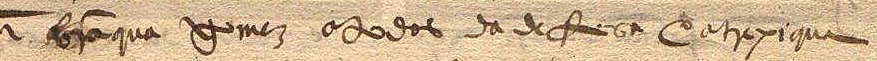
item brāqua gomez a todos da defesa e a trepiqua
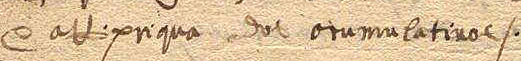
e a Repriqua dos acumulatiuos /.
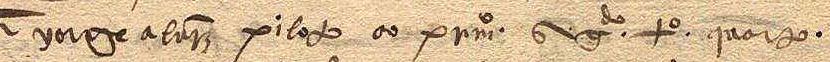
item yorge alur̄z piloto ao primo. segdo. to. quarto.
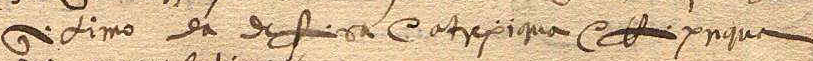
setimo da defesa e atrepiqua e Repriqua
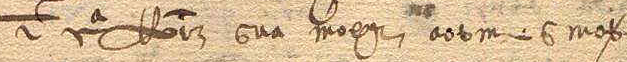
item ca Rōiz sua molher aos mesmos/
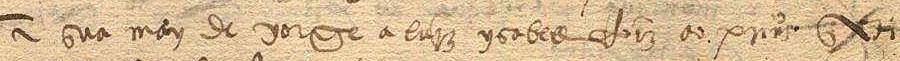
item sua may de yorge alur̄z ysabell Roīz ao primo seti
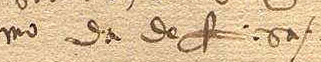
mo da defesa /.
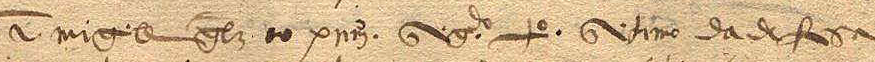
item migell ḡlz ao primo. segdo. to. setimo da defesa
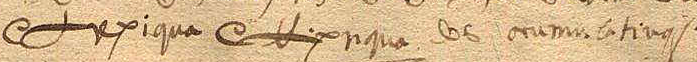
e trepiqua e Repriqua dos acumulatiuꝯ/.
